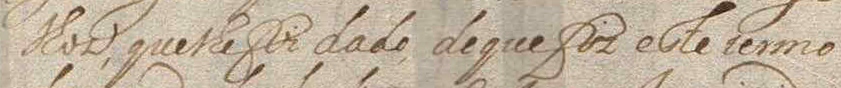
lhos, que lhe foi dado, de que fiz este termo
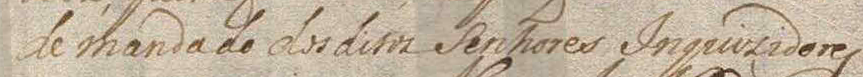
de mandado dos ditos senhores Inquizidores
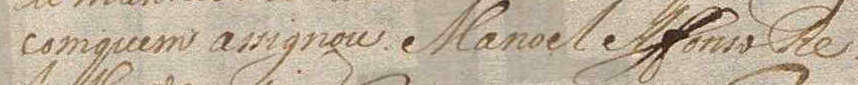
com quem assignou Manoel Affonso Re
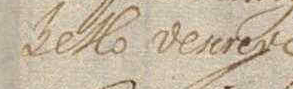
bello o escrevi
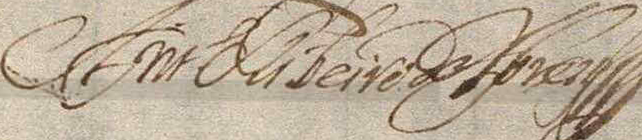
Ant Ribeiro de Abreu
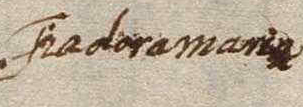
Fiadora maria
